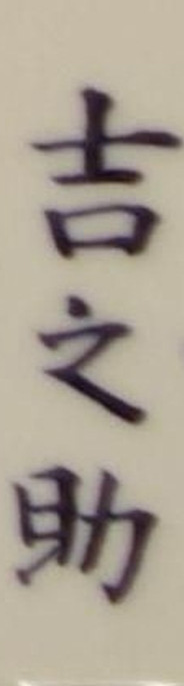吉之助
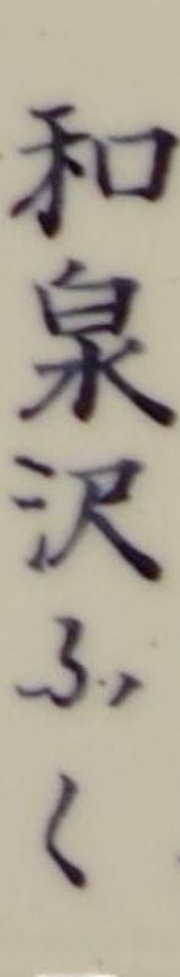和泉沢ふく
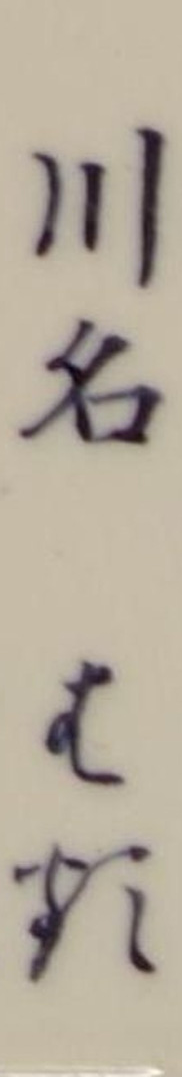川名はる
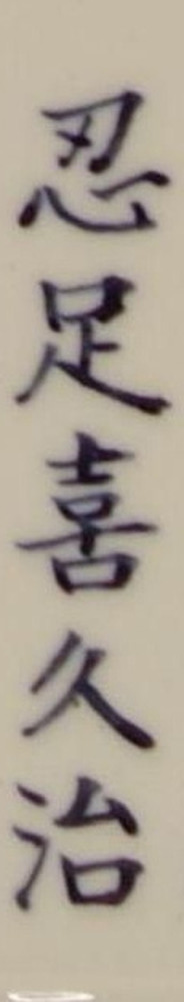忍足喜久治
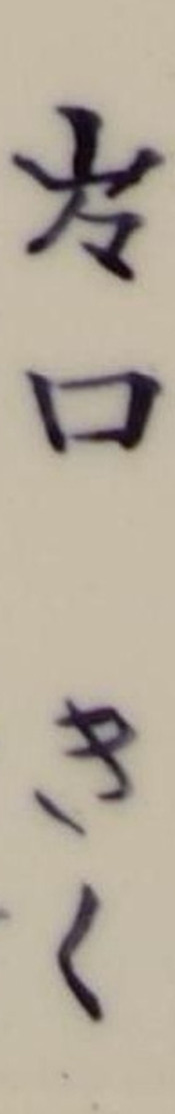出口きく
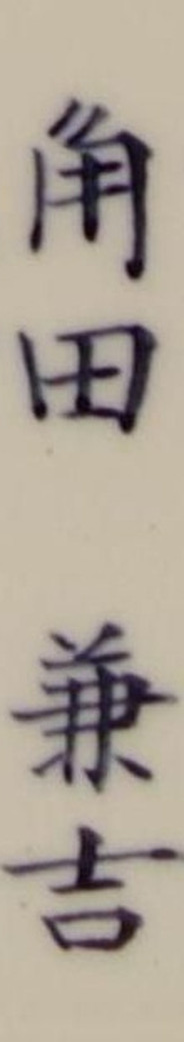角田兼吉
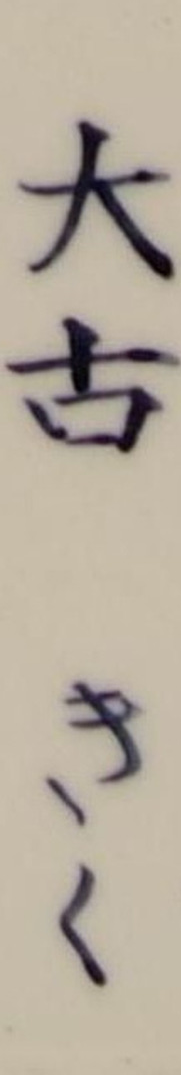大古きく
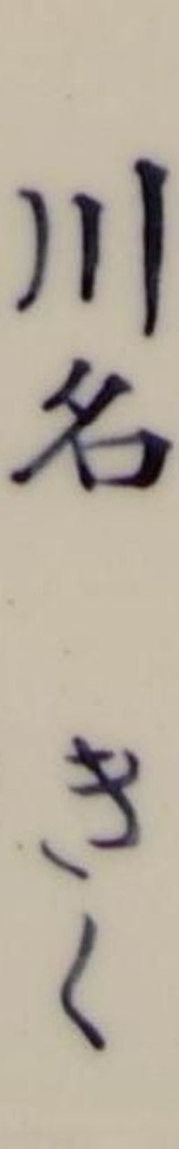川名きく
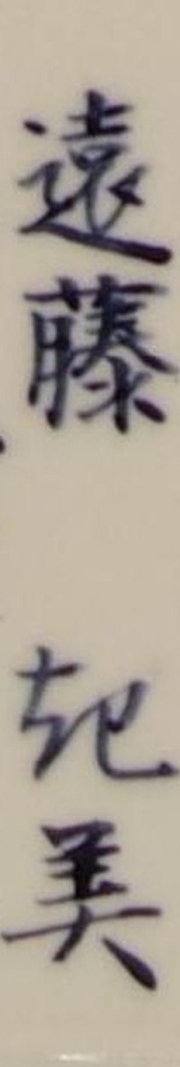遠藤記美
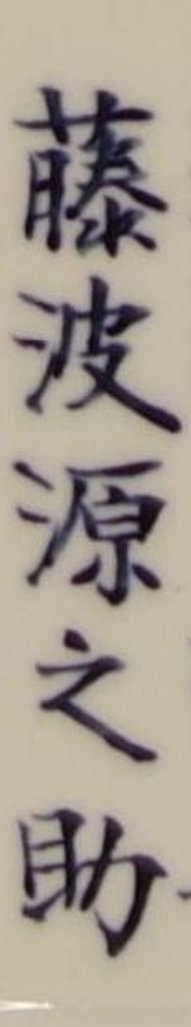藤波源之助
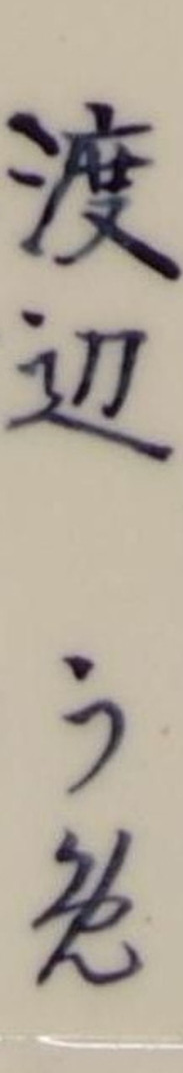渡辺うめ
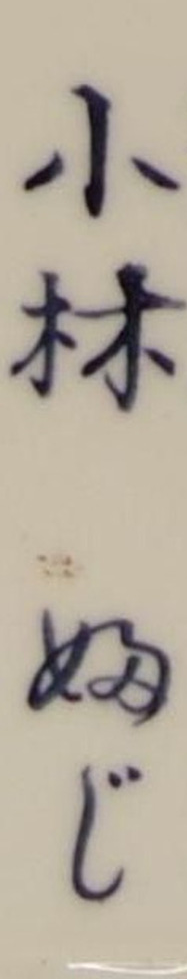小林ふじ
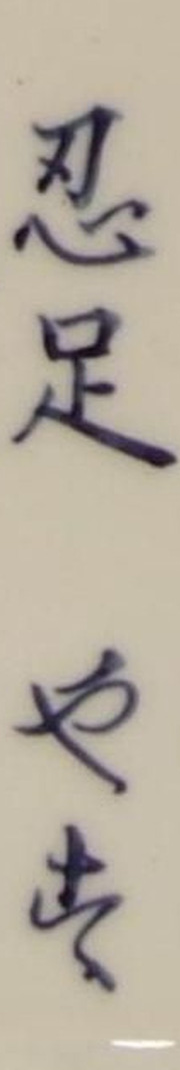忍足やす
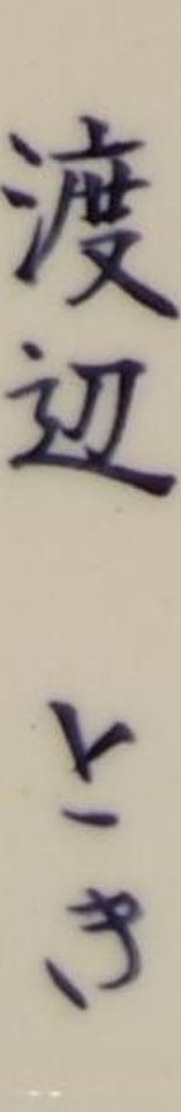渡辺とき
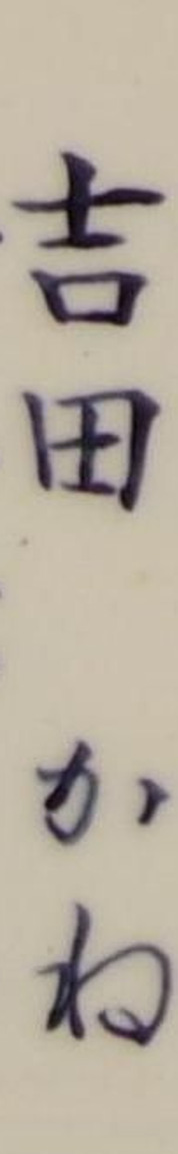吉田かね
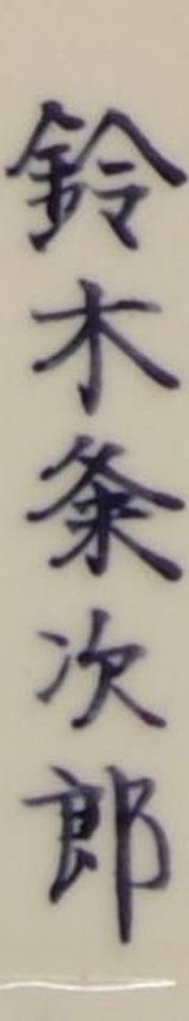鈴木粂次郎
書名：M~S
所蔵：高野山金剛峯寺
